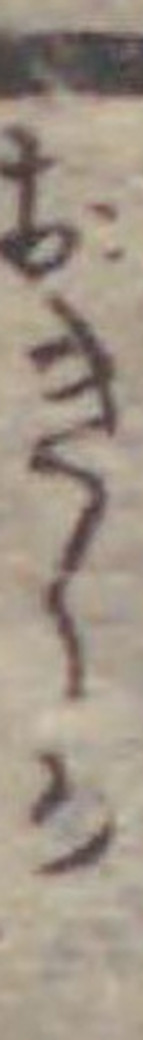おきくか
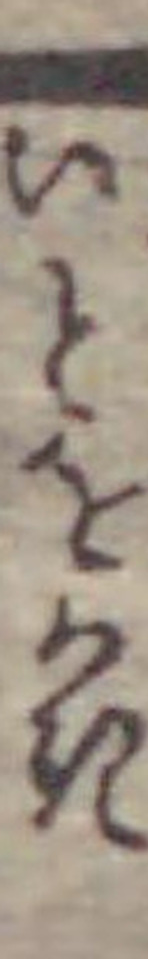いとをかき
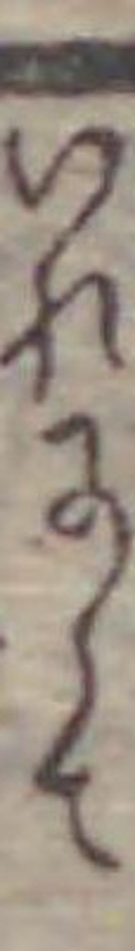いれにして
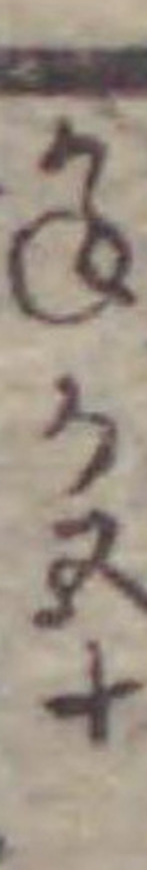かねか五十
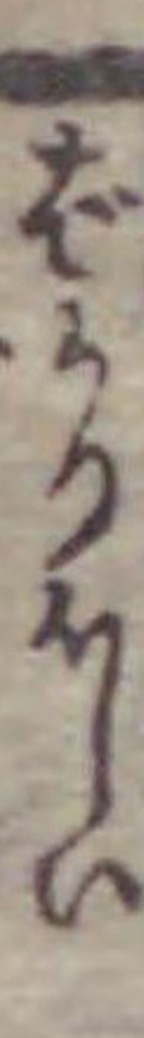ばかりほしい
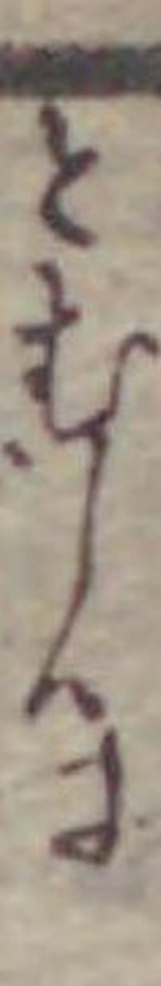とむしんに
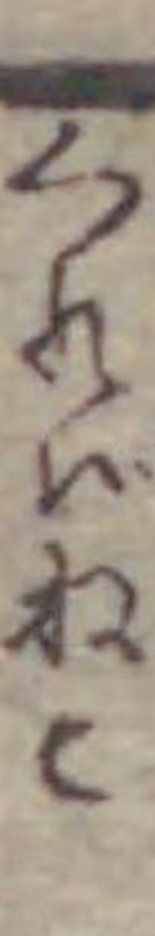くればねこ
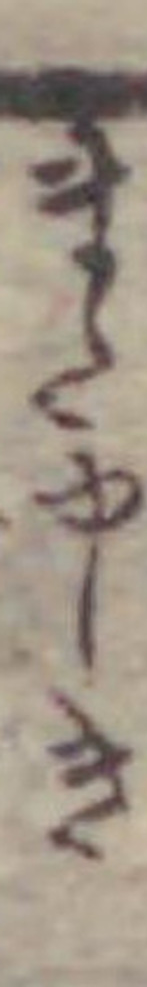またやしき
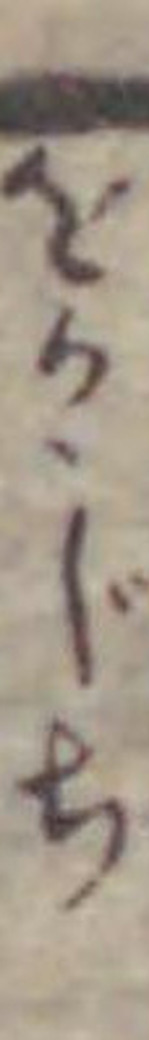をかしじち
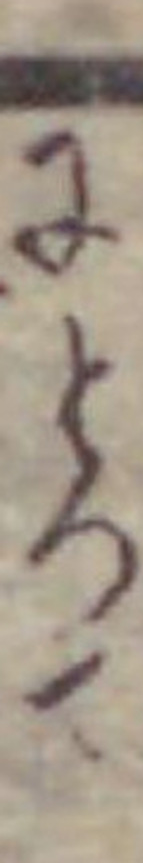にとつて
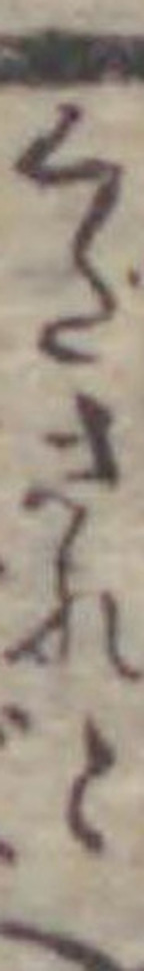くだされと
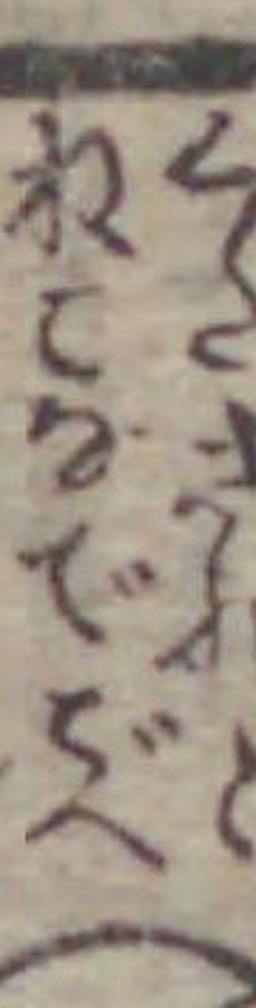ねこなでごへ
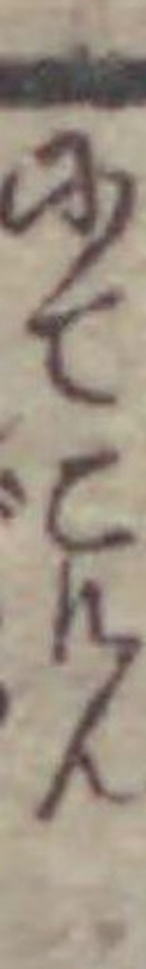にてこけん
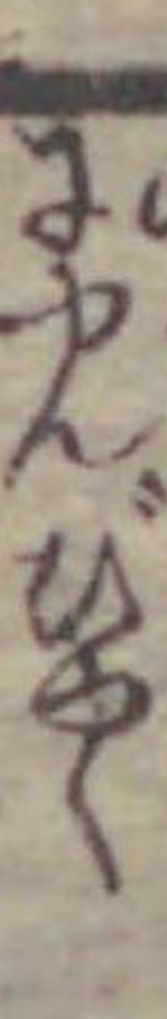にやんびやく
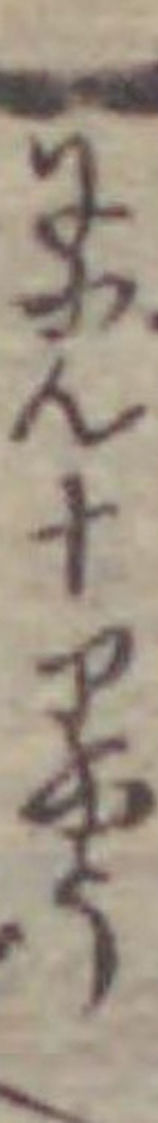にやん十りやう
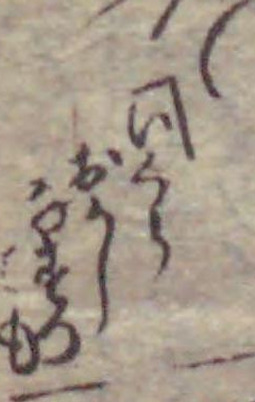おかし
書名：化物見世開 : 2巻
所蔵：国立国会図書館 National Diet Library, JAPAN
